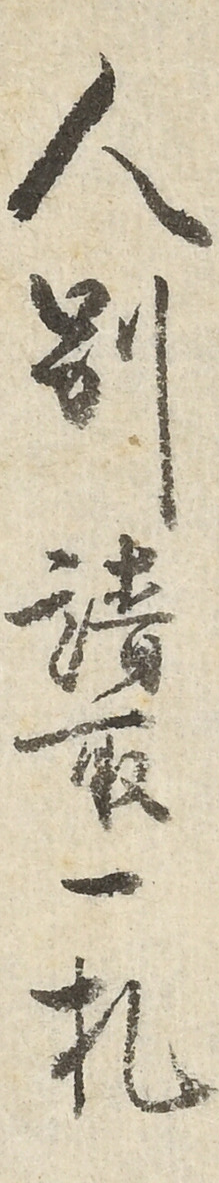人別請取一札

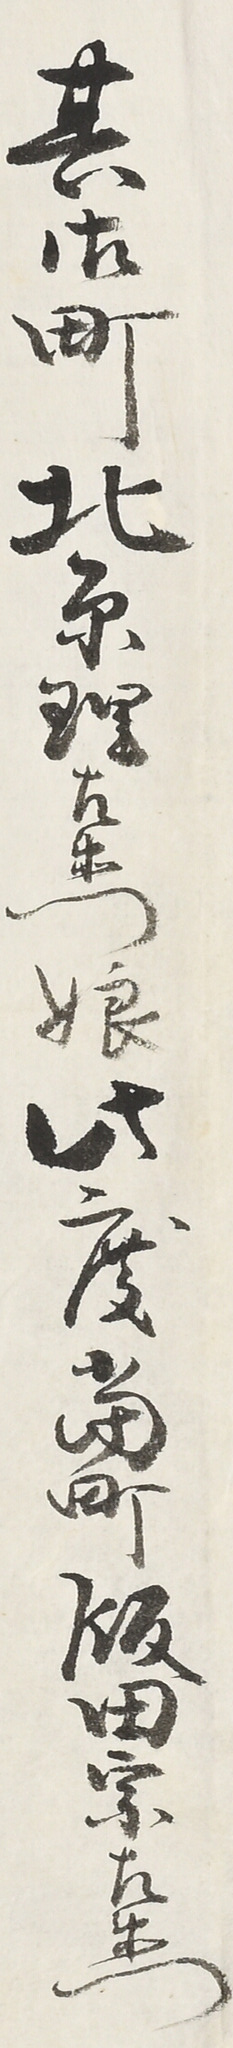其御町北原理左衛門娘此度当町飯田宗左衛門
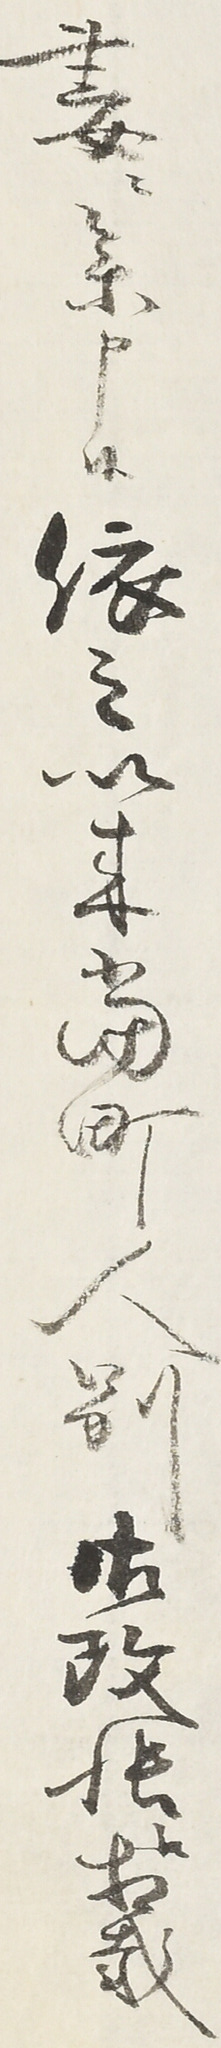妻ニ参申候依之以来当町人別御改帳江相載
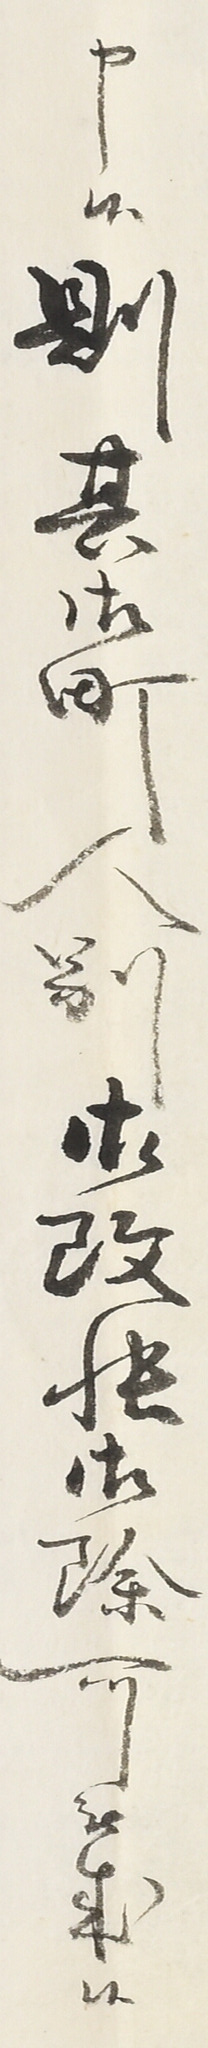申候則其御町人別御改帳御除可被成候
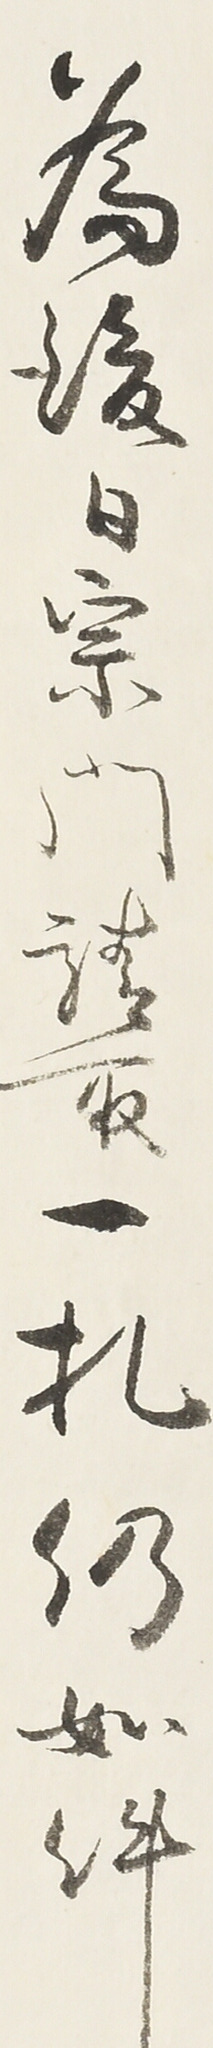為後日宗門請取一札仍如件
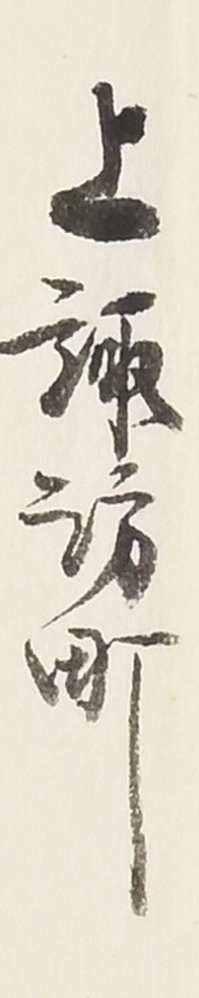上諏訪町
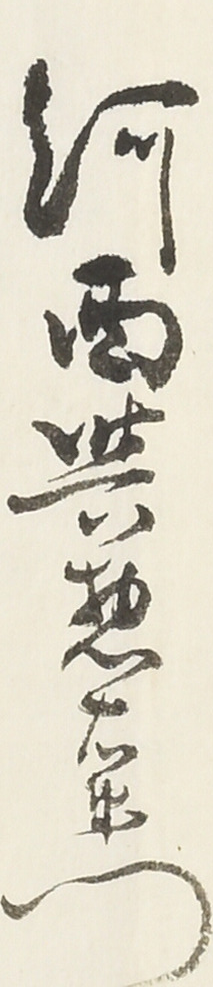河西与惣右衛門㊞
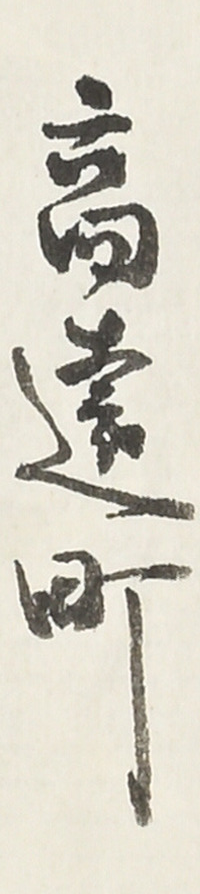高遠町
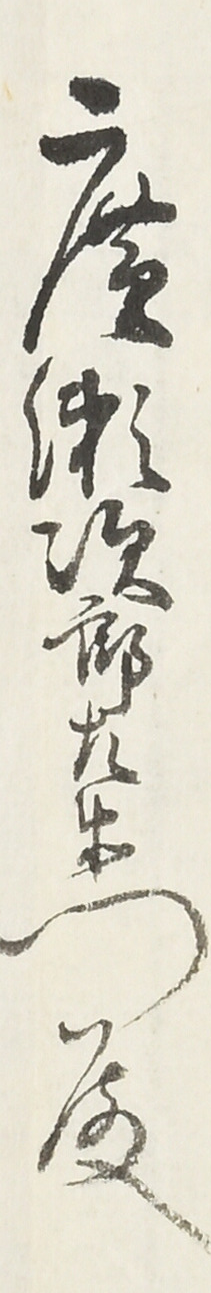広瀬次郎左衛門殿
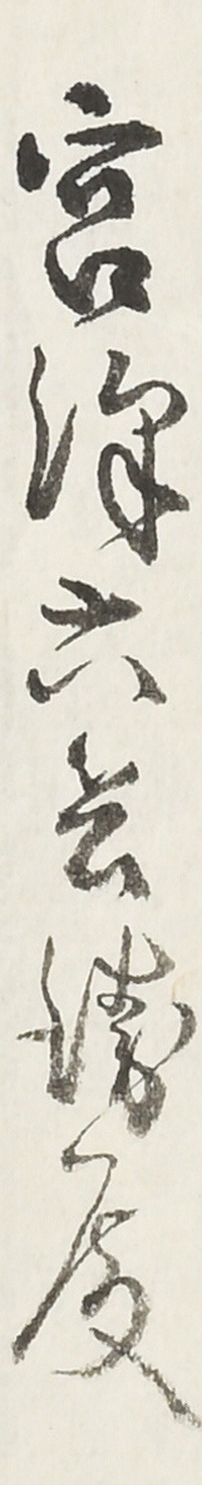宮澤六兵衛殿
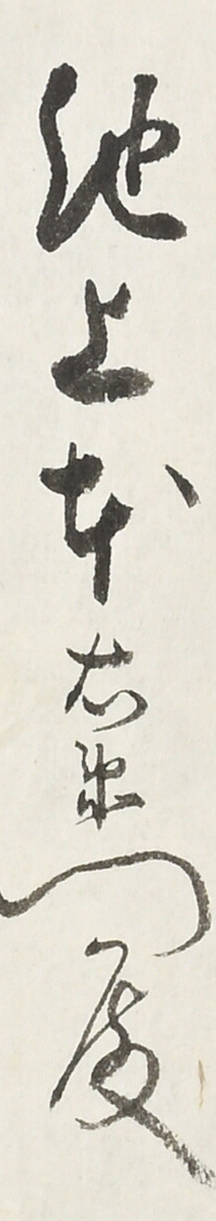池上本右衛門殿
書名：人別請取一札
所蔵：伊那市立高遠町図書館・合同会社AMANE
